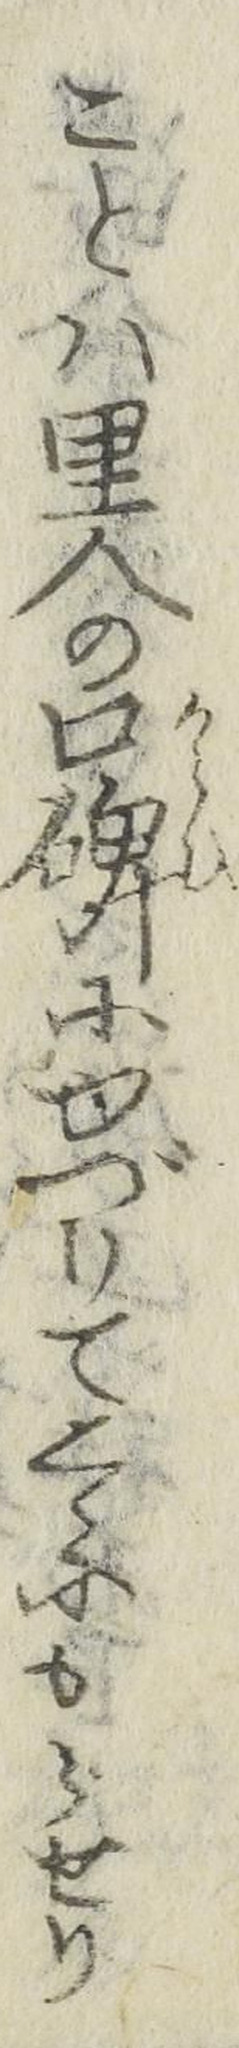ことは里人の口碑にゆづりてこゝにもらせり
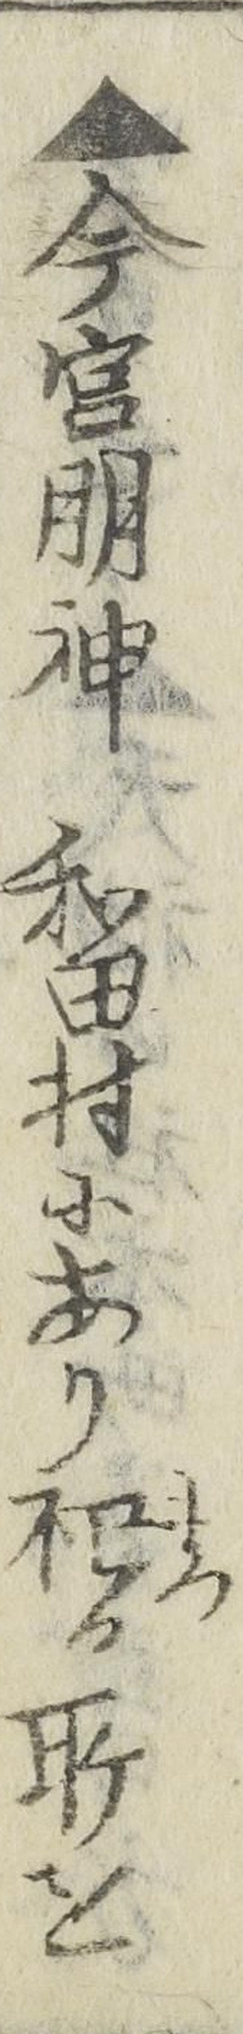▲今宮明神和田村にあり祀る所を

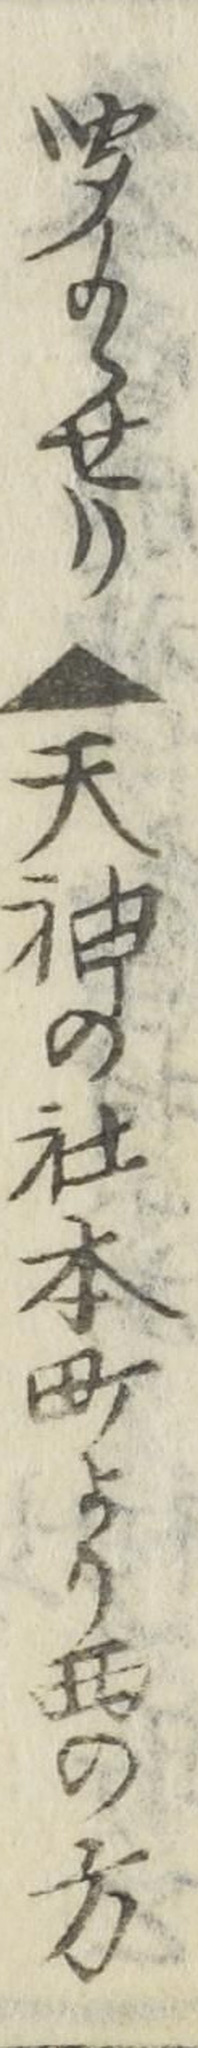聞もらせり▲天神の社本町より西の方
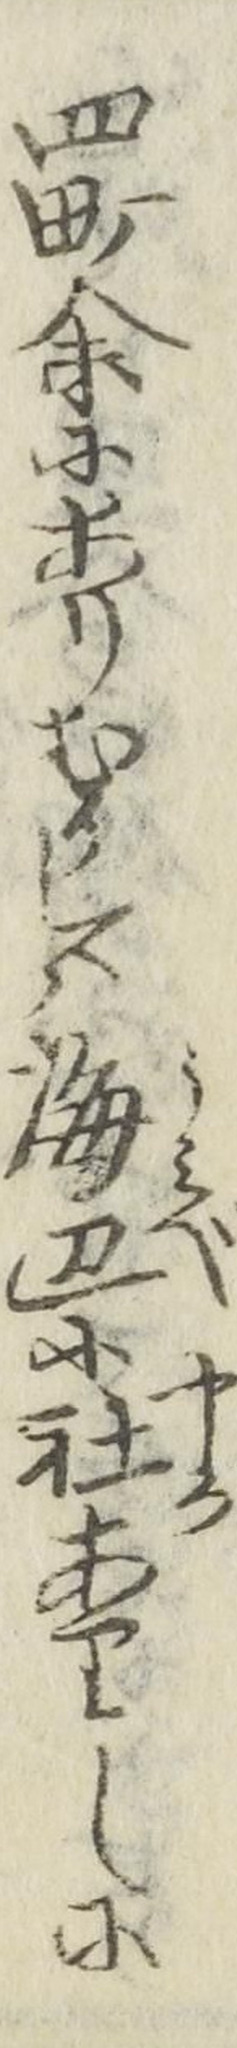四町余にありむかしは海辺に社ありしに
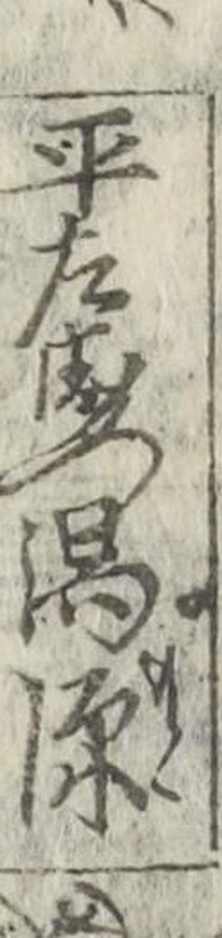平左衛門湯源
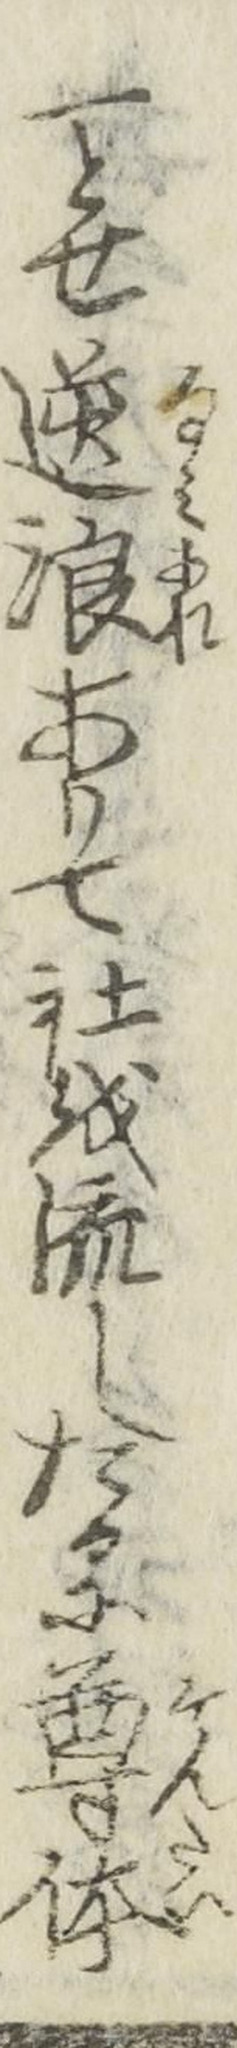一とせ逆浪ありて社を流したるに尊体
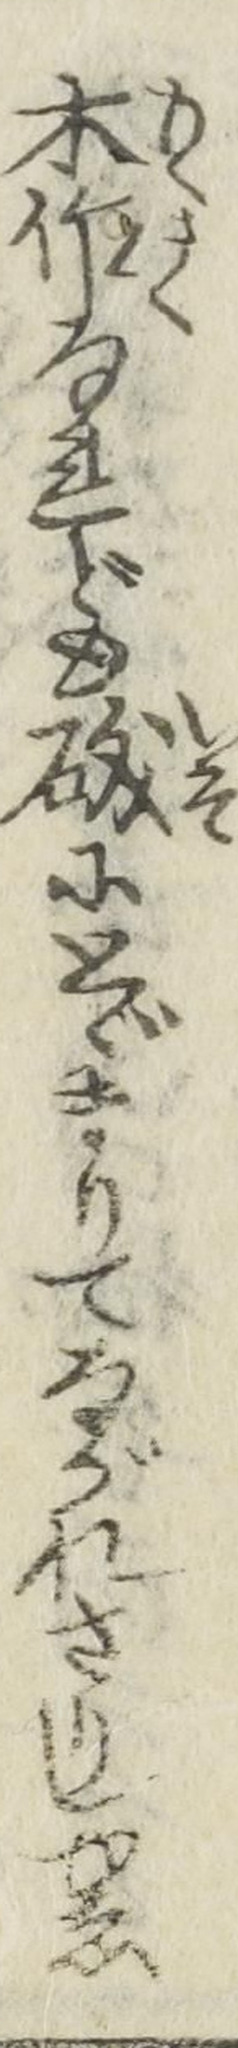木作なれども磯にとゞまりてながれさりしゆゑ
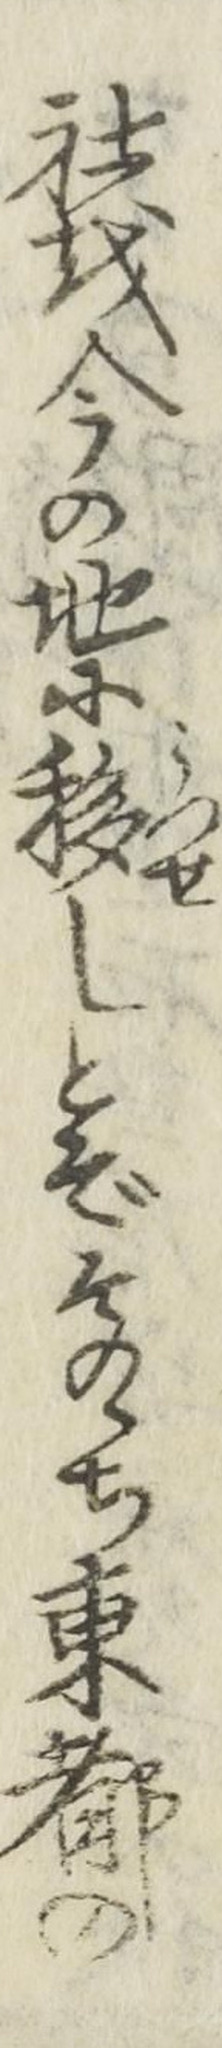社を今の地に移しとぞそのゝち東都の
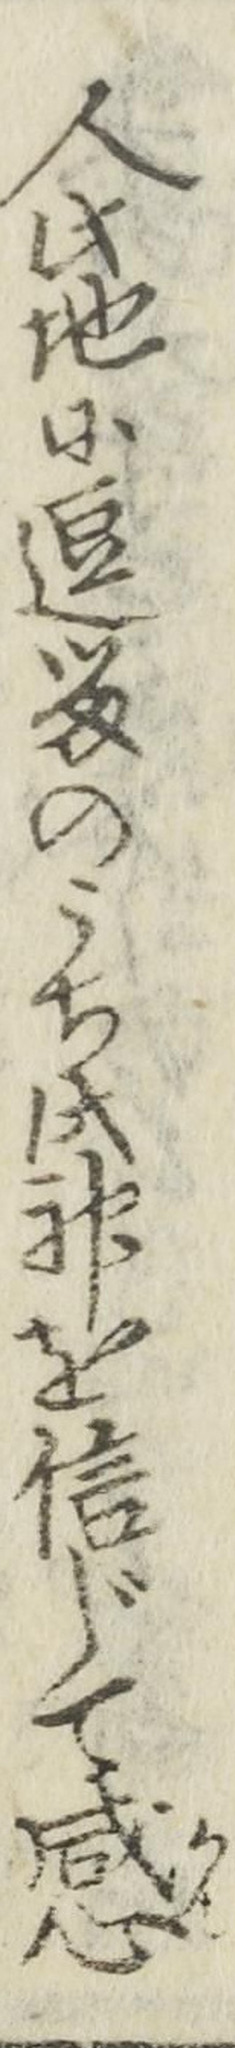人此地に逗留のうち此神を信じて感
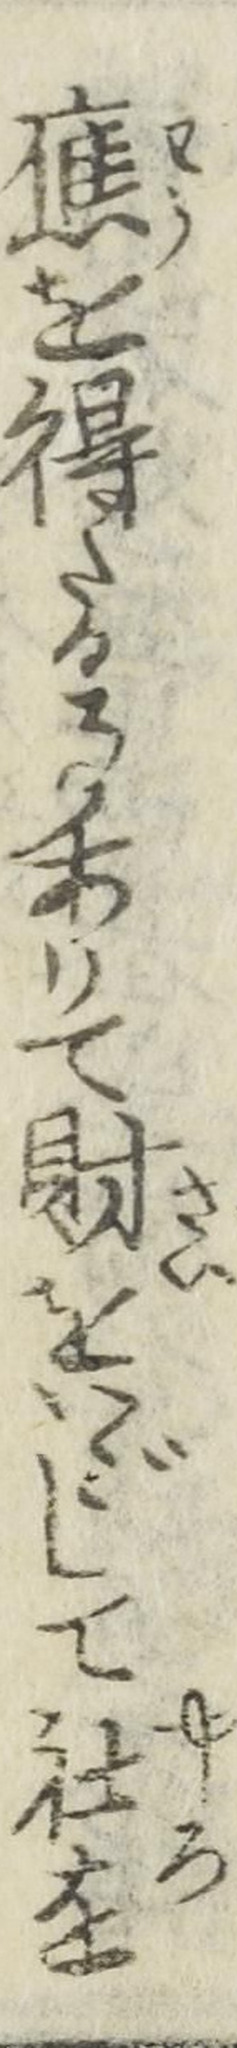応を得たる事ありて財をいだして社を
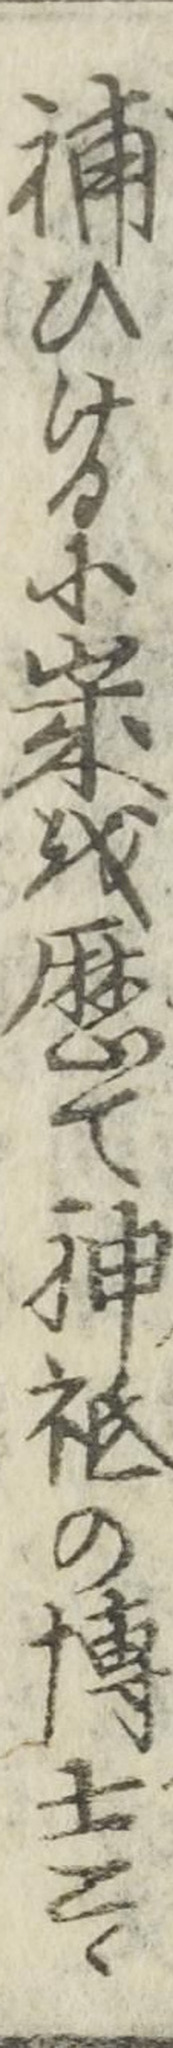補ひけるに歳を歴て神祇の博士こゝ
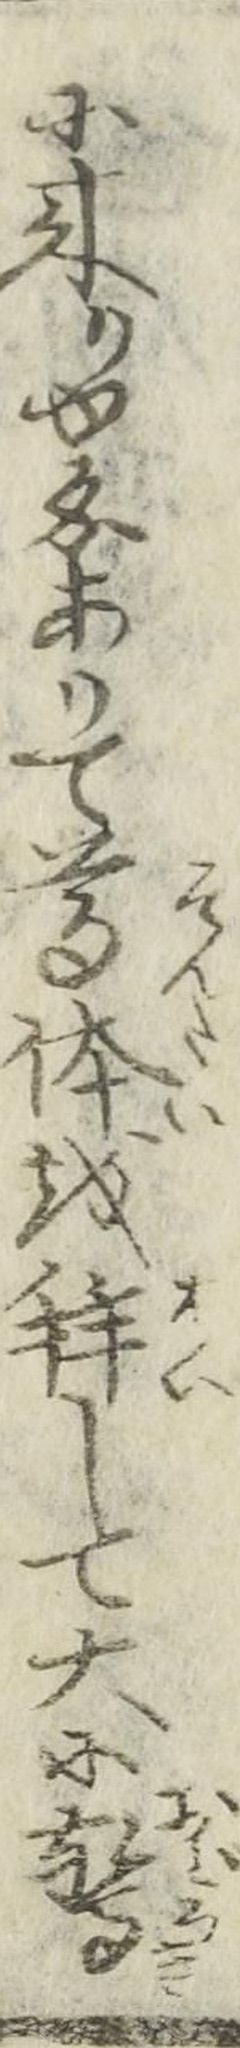に来りゆゑありて尊体を拝して大に驚
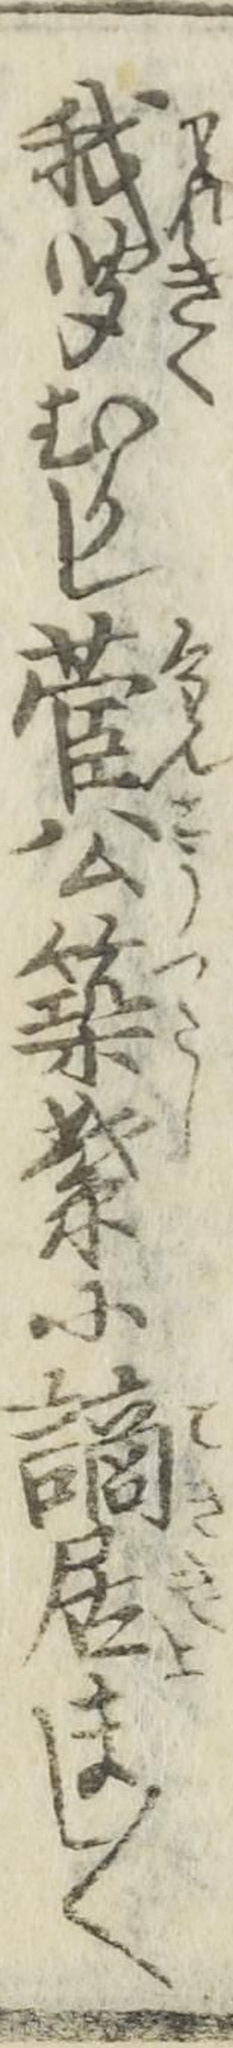我聞むかし菅公筑紫に謫居まし〳〵
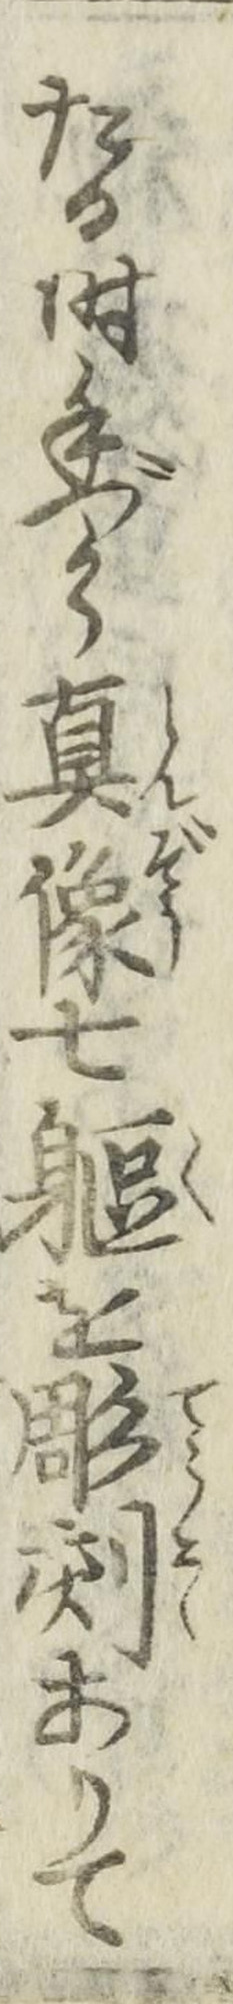たる時手づから真像七躯を彫刻ありて
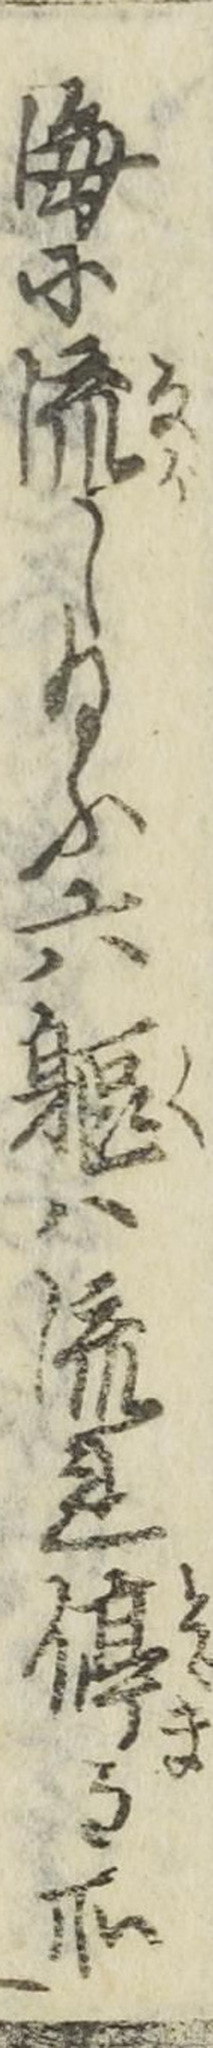海に流し給ふ六躯は流れ停る所
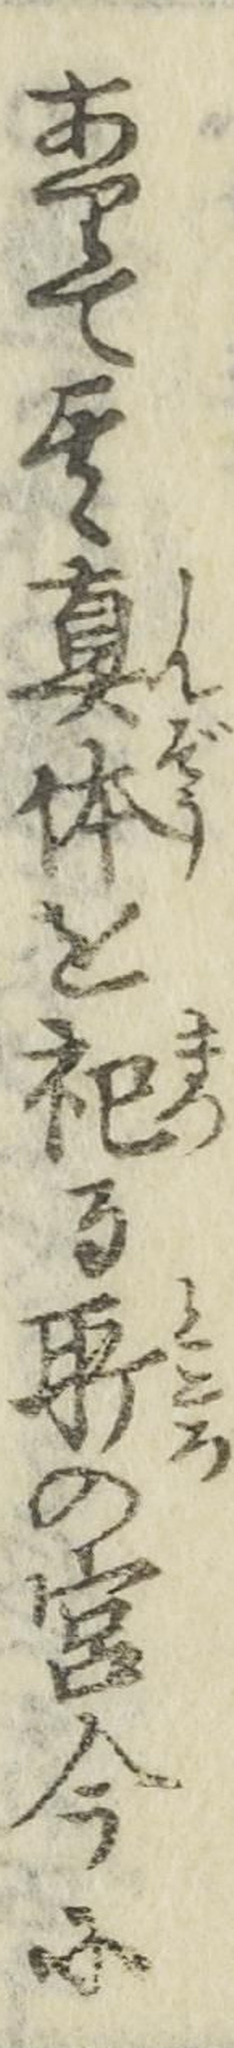ありて其真体を祀る所の宮今に
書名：熱海温泉圖彙
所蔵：東京大学地震研究所図書室 Earthquake Research Institute Library, The University of Tokyo, JAPAN
